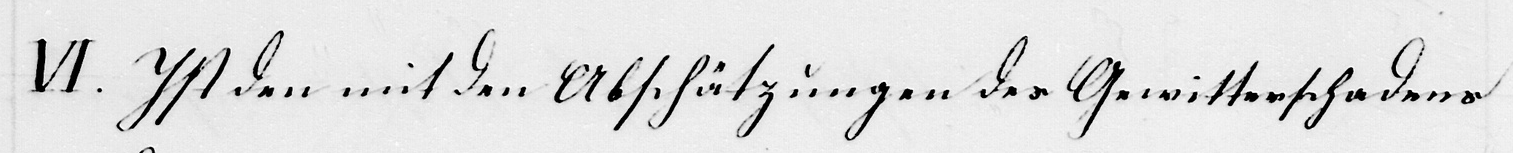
VI. Ist den mit den Abschätzungen des Gewitterschadens
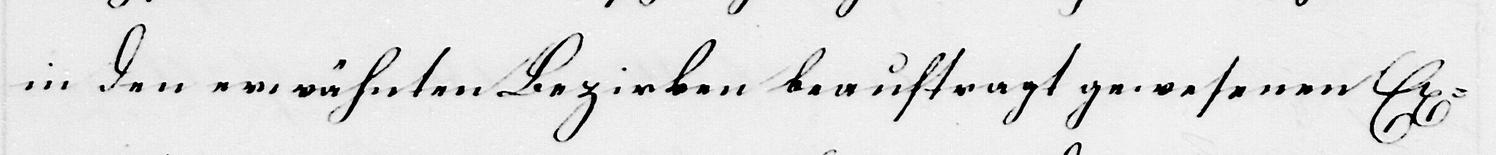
in den erwähnten Bezirken beauftragt gewesenen Ex¬
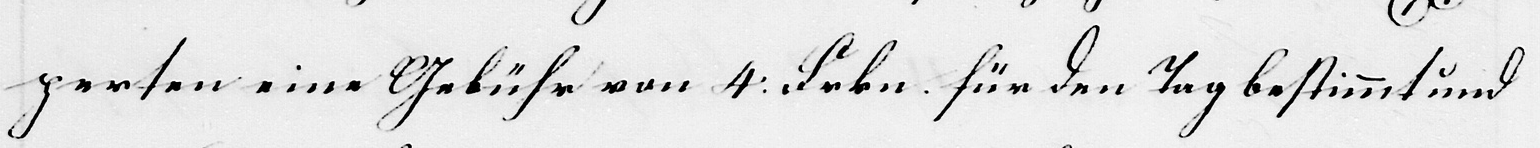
perten eine Gebühr von 4. Frkn. für den Tag bestimmt und
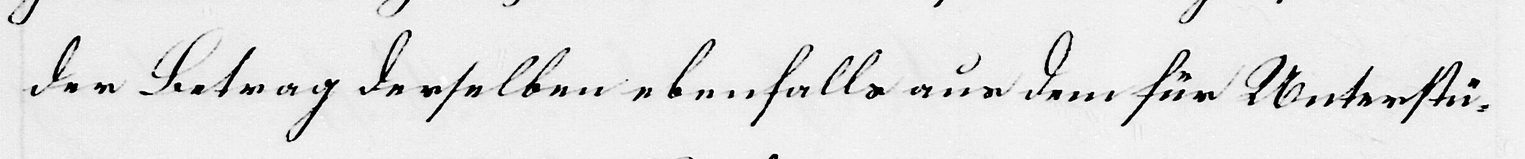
den Betrag derselben ebenfalls aus dem für Unterstü¬
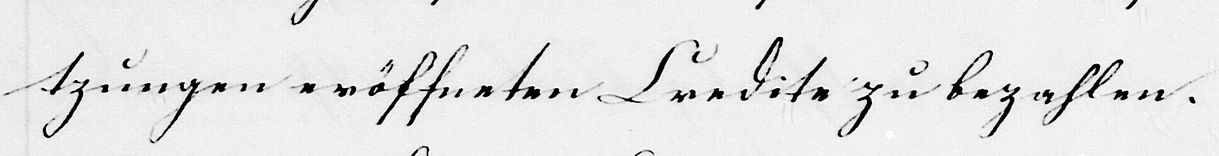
tzungen eröffneten Credite zu bezahlen.
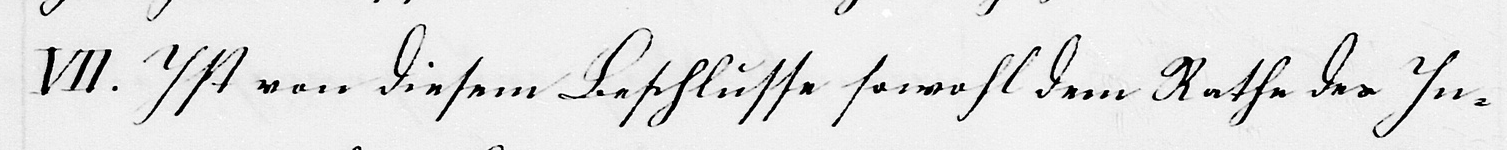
VII. Ist von diesem Beschlusse sowohl dem Rathe des In¬
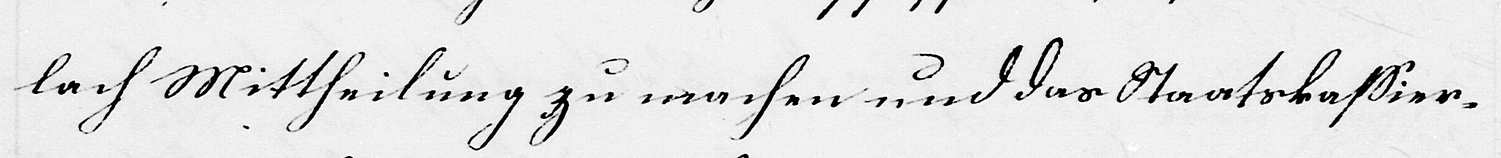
lach Mittheilung zu machen und das Staatskaßier¬
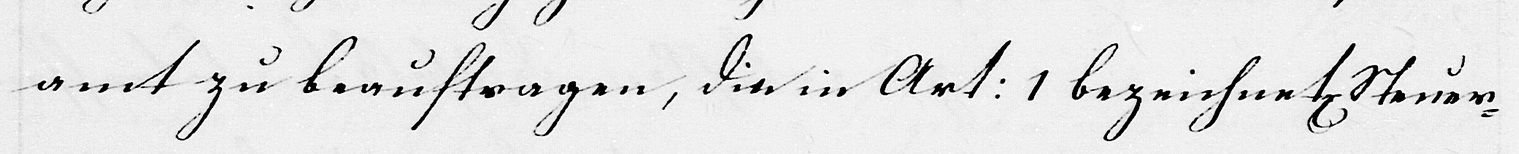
amt zu beauftragen, die in Art: 1 bezeichnet[en] Steuer¬
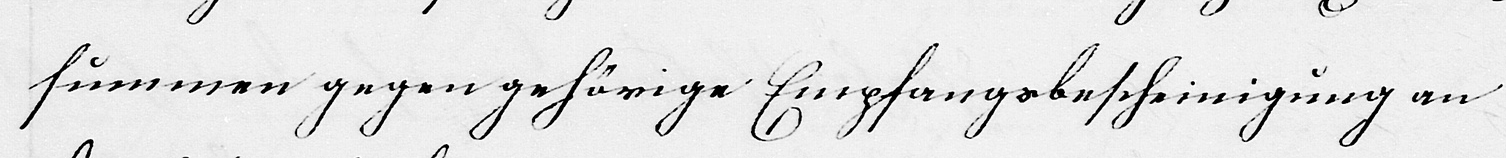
summen gegen gehörige Empfangsbescheinigung an
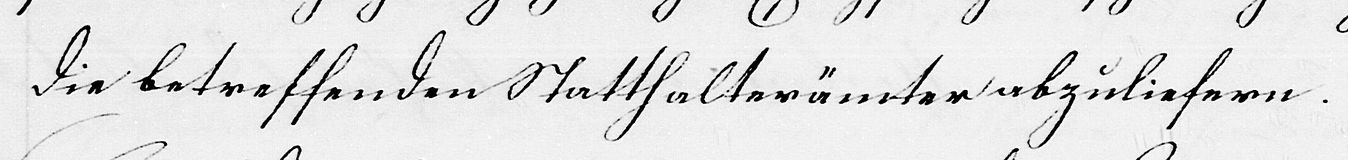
die betreffenden Statthalterämter abzuliefern.
